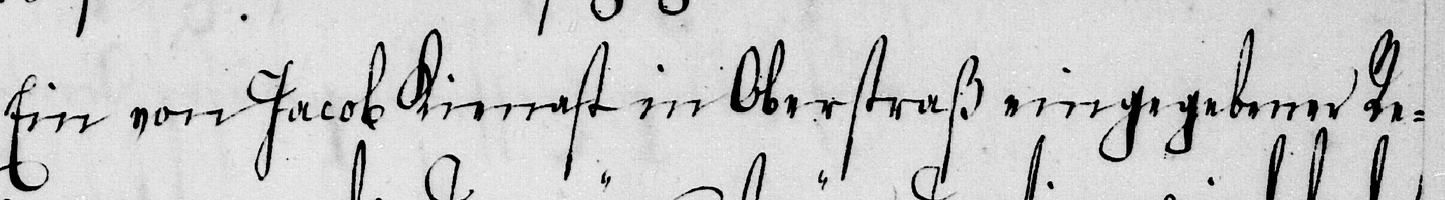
Ein von Jacob Kienast in Oberstraß eingegebener Re¬
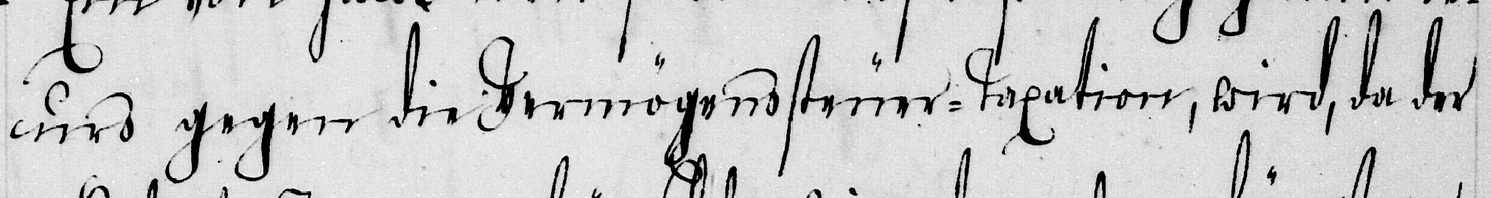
curs gegen die Vermögenssteuer-Taxation, wird, da der
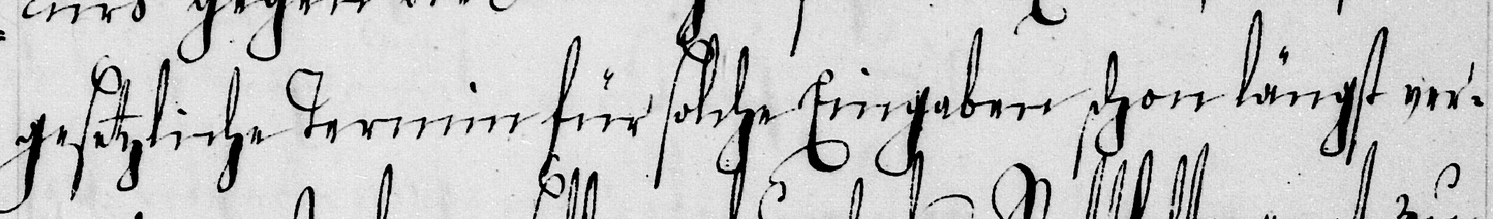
gesetzliche Termin für solche Eingaben schon längst ver¬
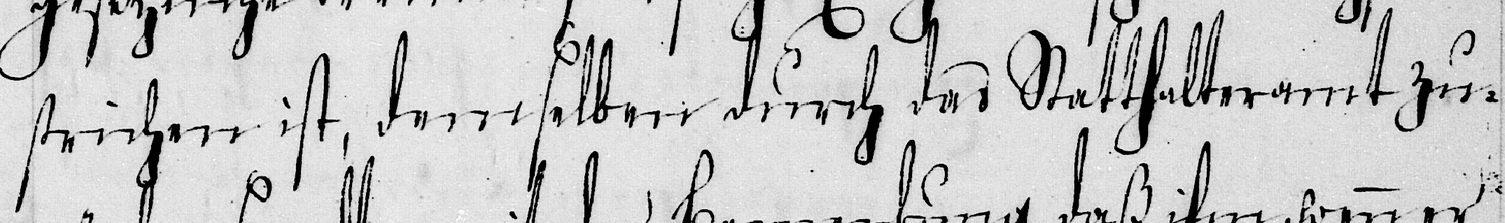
strichen ist, dem selben durch das Statthalteramt zu¬
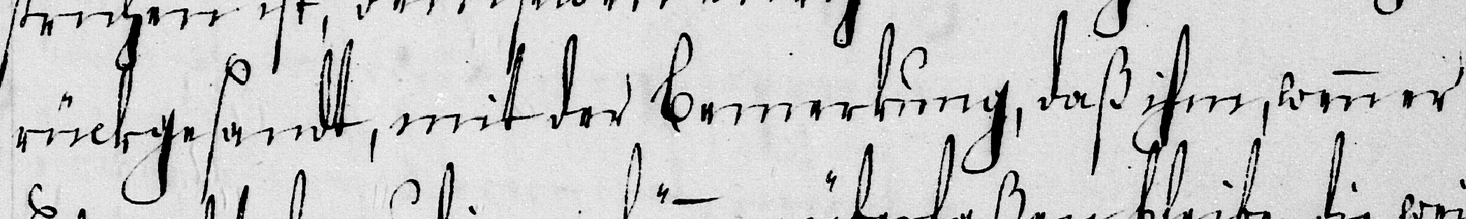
rückgesandt, mit der Bemerkung, daß ihm, wenn er
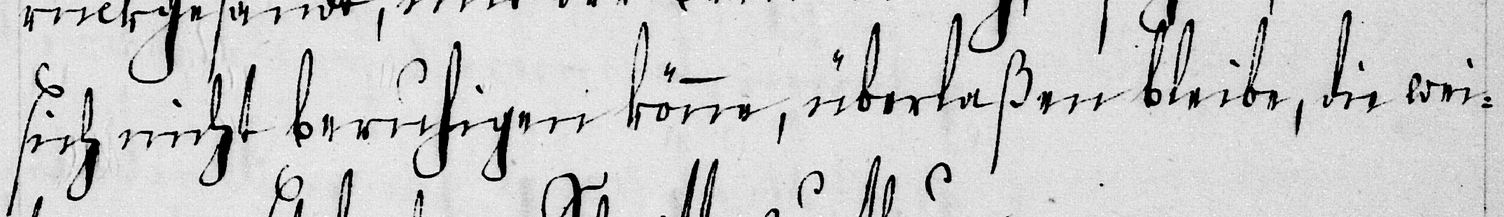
sich nicht beruhigen könne, überlaßen bleibe, die wei¬
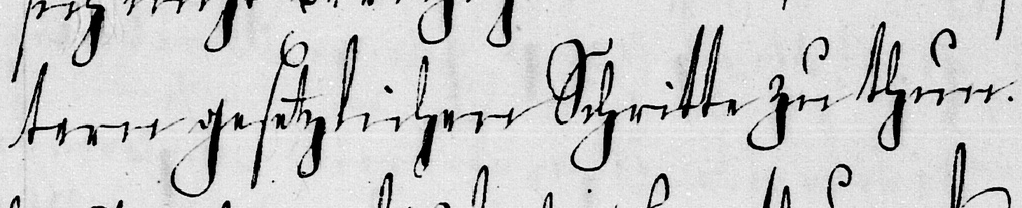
tern gesetzlichen Schritte zu thun.
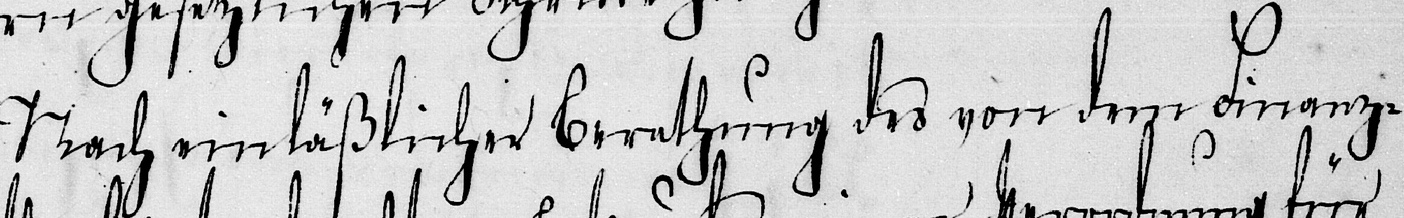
Nach einläßlicher Berathung des von dem Finanz¬
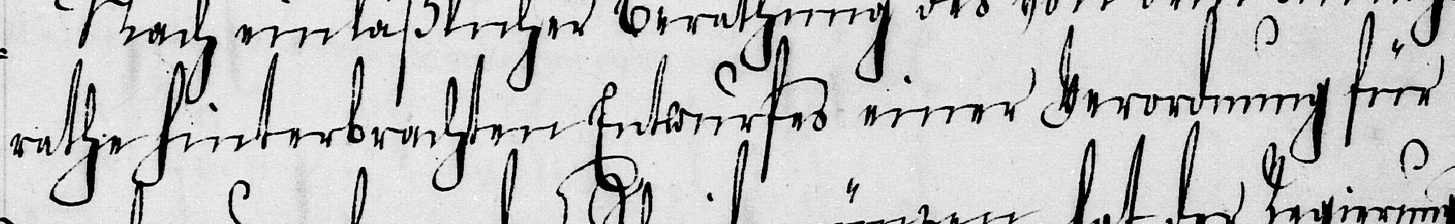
rathe hinterbrachten Entwurfes einer Verordnung für
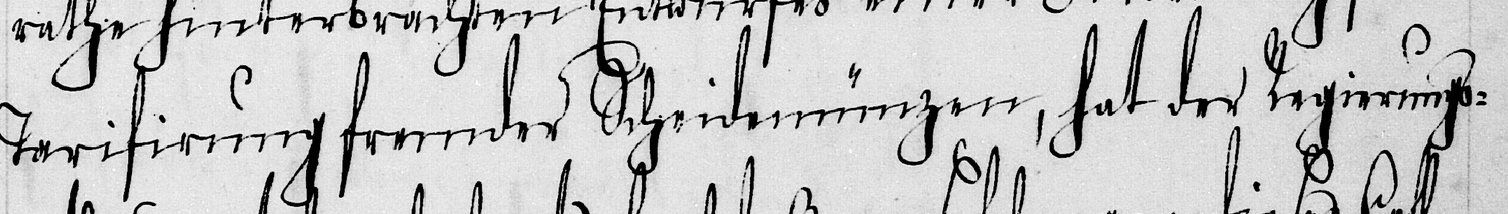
Tarifirung fremder Scheidemünzen, hat der Regierungs¬
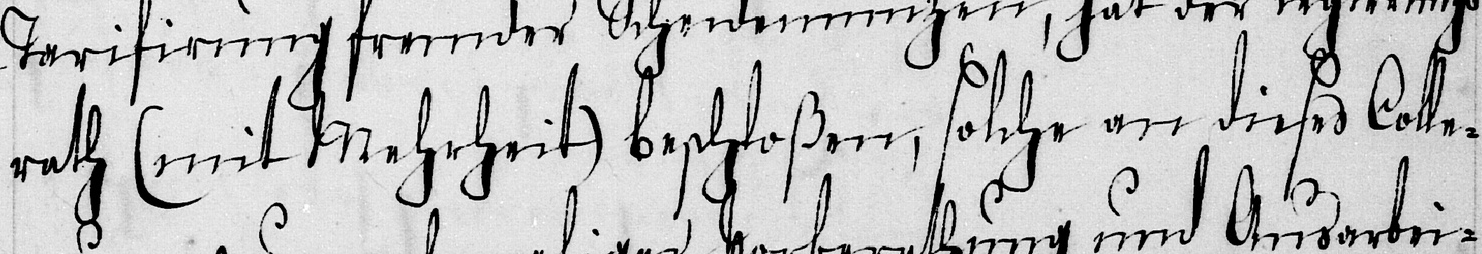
rath (mit Mehrheit) beschloßen, soche an dieses Col¬
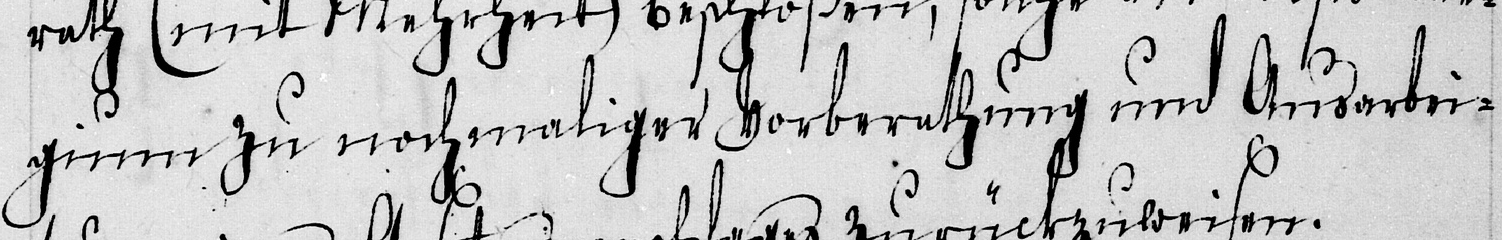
gium zu nochmaliger Vorberathung und Ausarbei¬
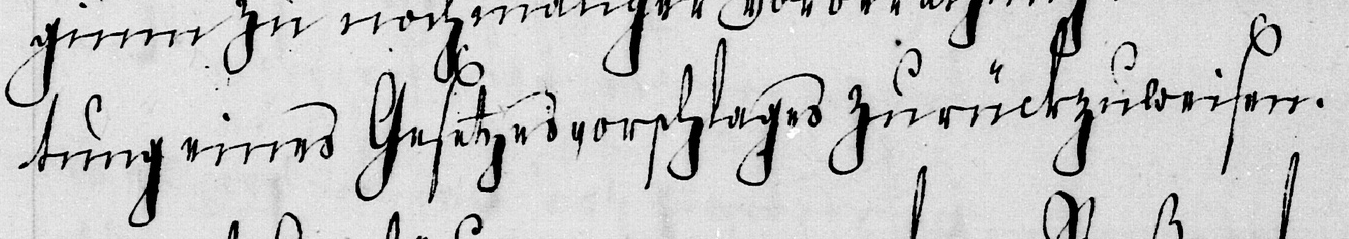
tung eines Gesetzesvorschlages zurückzuweisen.
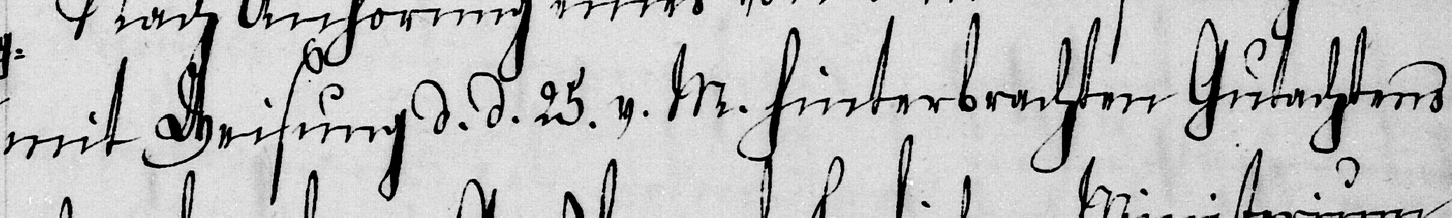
mit Weisung d. d. 25. v. M. hinterbrachten Gutachtens
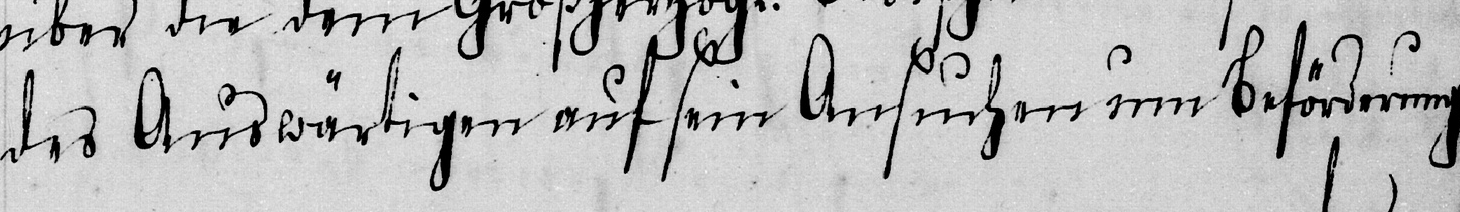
des Auswärtigen auf sein Ansuchen um Beförderung
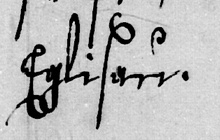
Badischen
